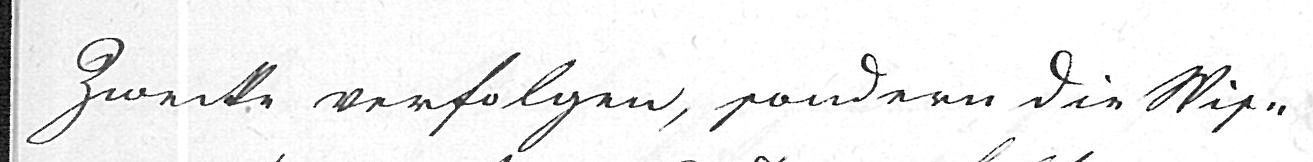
Zwecke verfolgen, sondern die Wis-
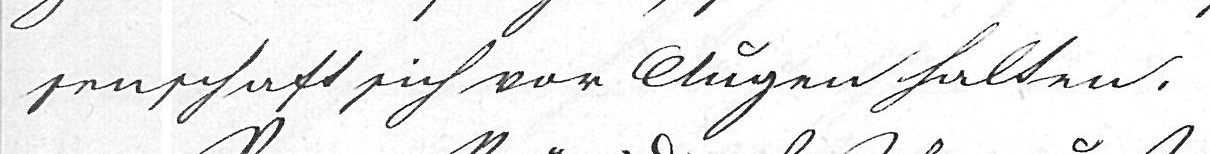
senschaft sich vor Augen halten.
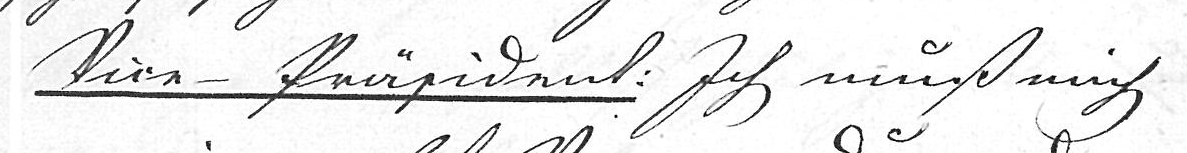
Vice-Präsident: Ich muß mich
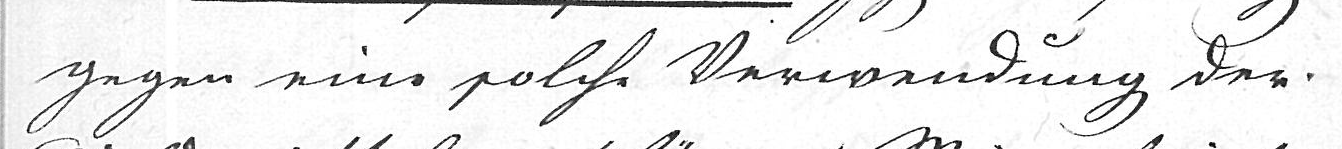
gegen eine solche Verwendung der
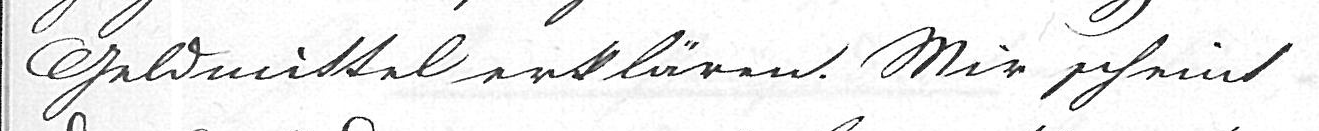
Galdmittel erklären. Mir scheint
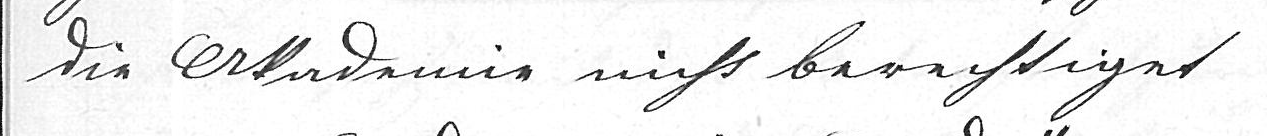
die Akademie nicht berechtiget
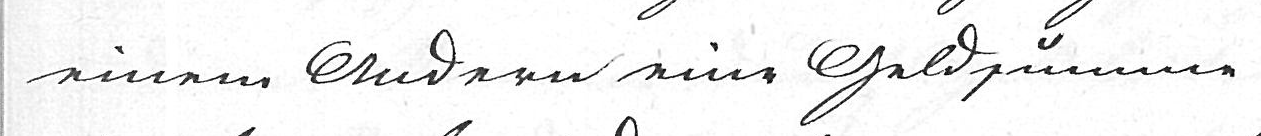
einem Andern eine Geldsumme
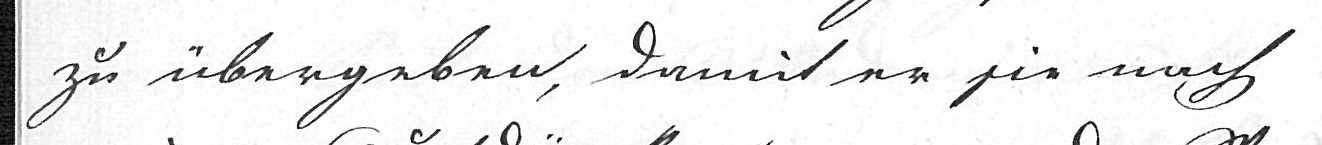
zu übergeben, damit er sie nach
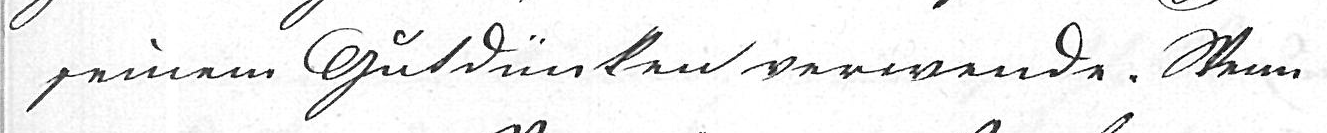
seinem Gutdünken verwende. Wenn
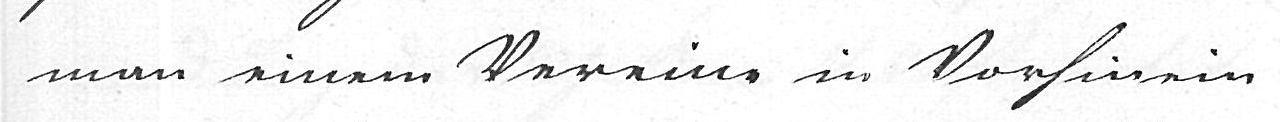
man einen Vereine in Vorhinein
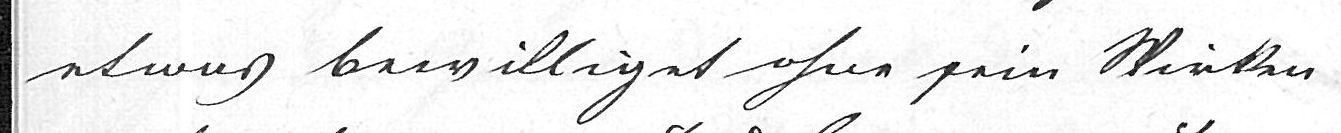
etwas bewilliget ohne sein Wirken
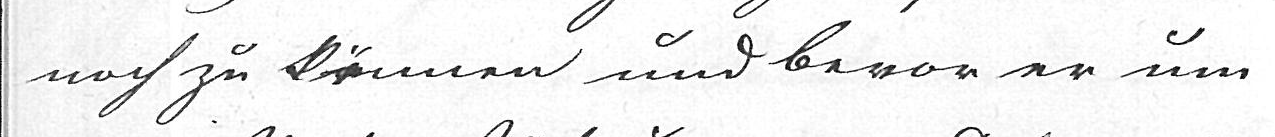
nach zu kennen und bevor er um
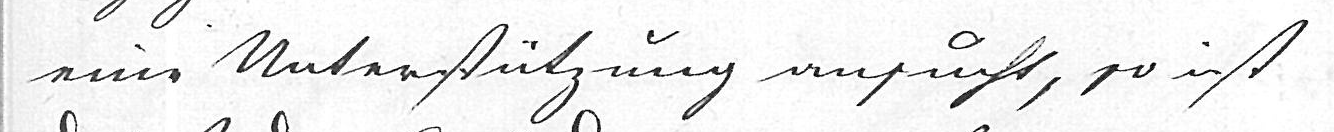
eine Unterstützung ansucht, so ist
